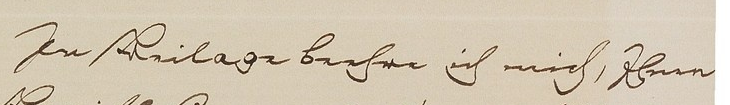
In Beilage beehre ich mich, Ihnen
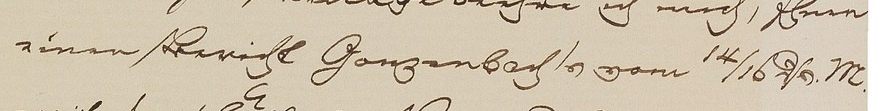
einen Bericht Gonzenbach's vom 14/ 16 dss. M.
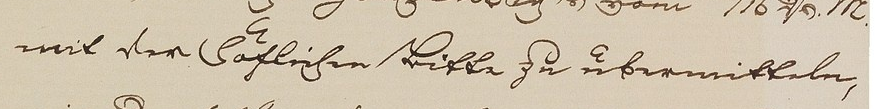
mit der höflichen Bitte zu übermitteln,
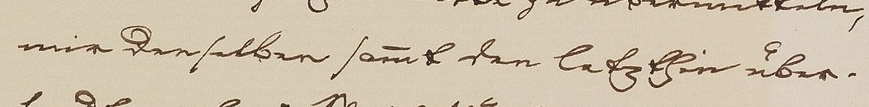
mir denselben sammt den letzthin über-
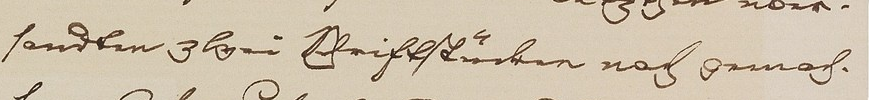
sandten zwei Schriftstücken nach gemach-
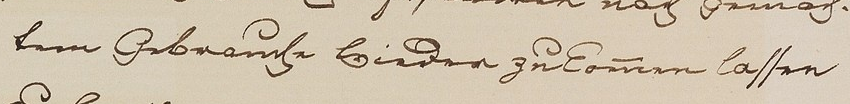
tem Gebrauche wieder zukommen lassen
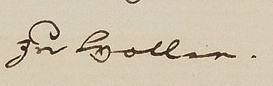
zu wollen.
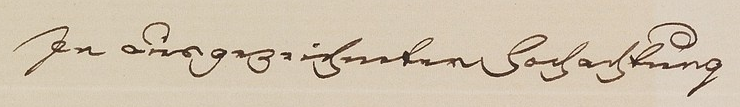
In ausgezeichneter Hochachtung
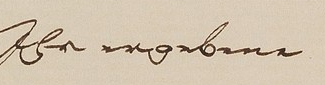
Ihr ergebene
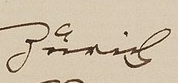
Zürich
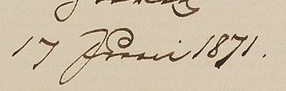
17 Juni 1871.
